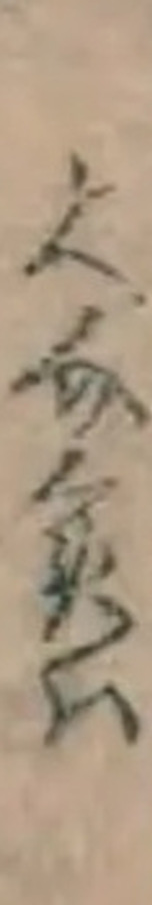大介実は
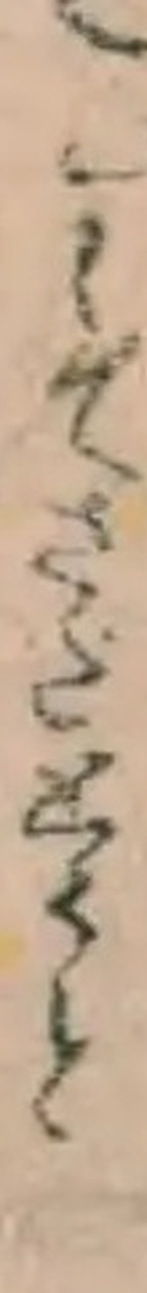してさだとうと
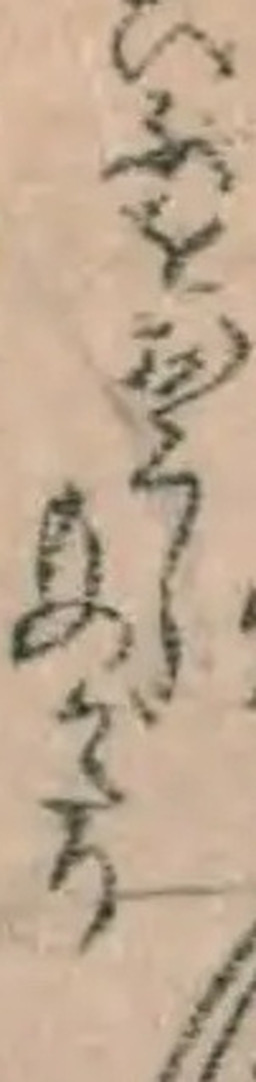ものがたり
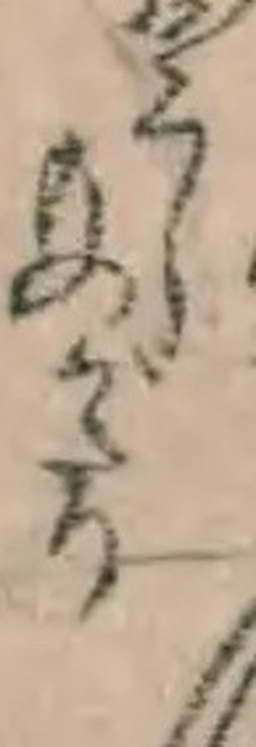ものがたり
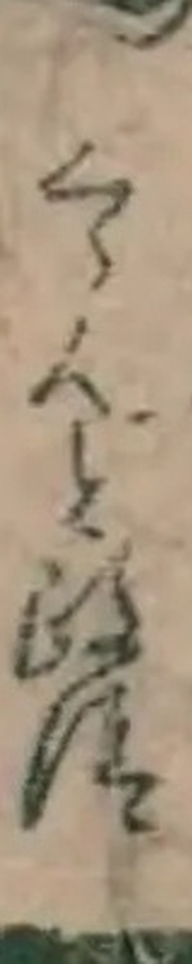くらんと政清
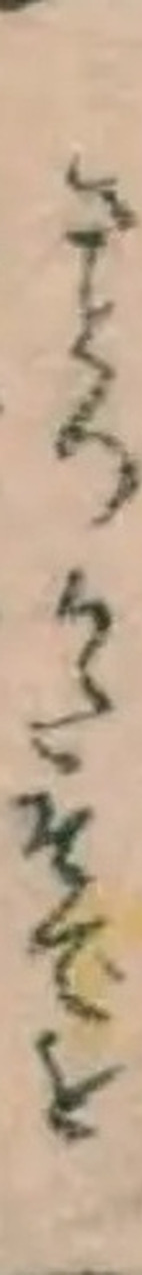さとりかたそでを
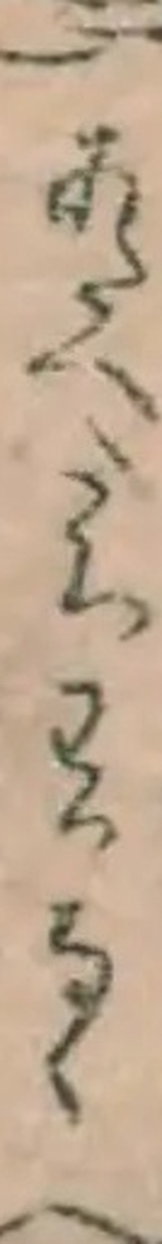あたへたちわかるゝ
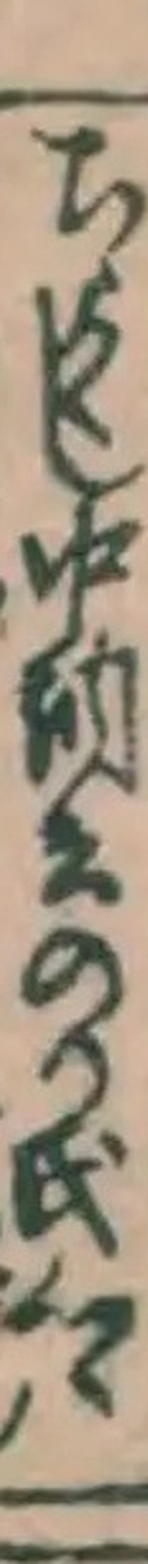ちよくし中納言のり氏卿
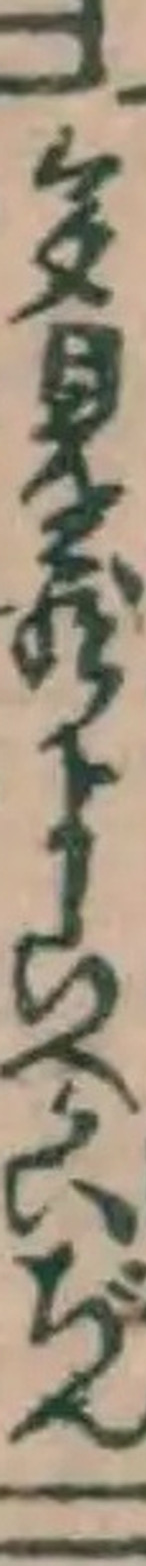多見蔵よしいへかいぢん
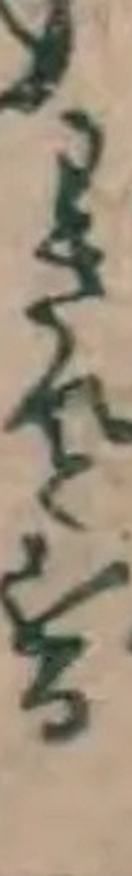わさんとする
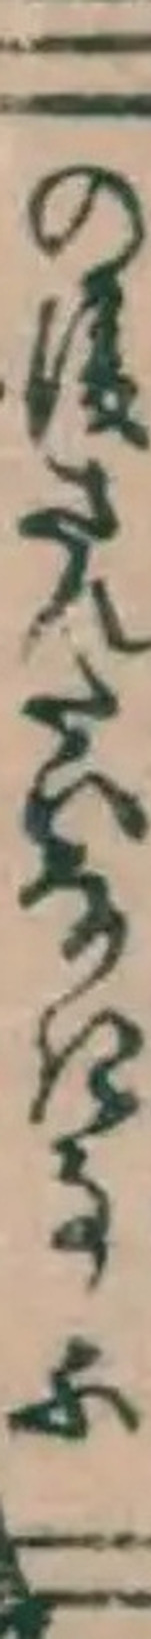の後さんたいなき事ふ
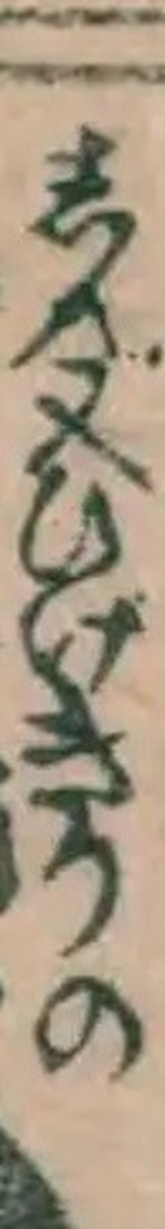しん又ひけきりの
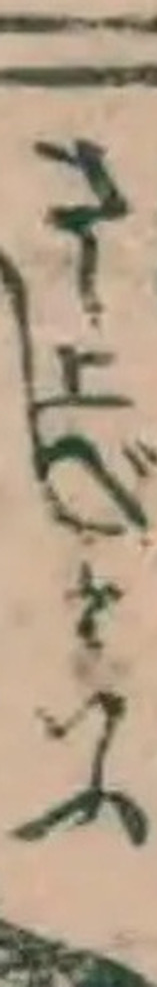さし上べしといふ
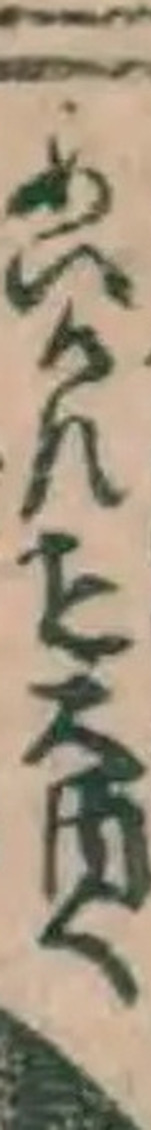めいけんを大内へ
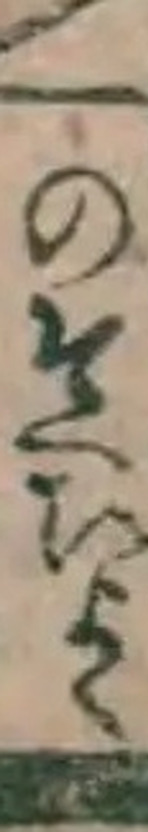のそへちよく
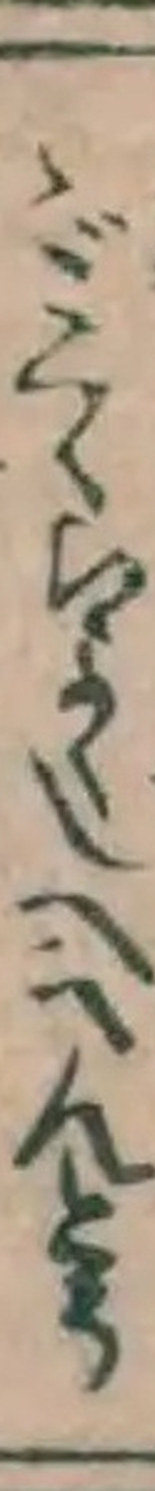ごこくちよくしへへんとう
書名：伊達錦對将 : 森田座
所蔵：国立国会図書館 National Diet Library, JAPAN
